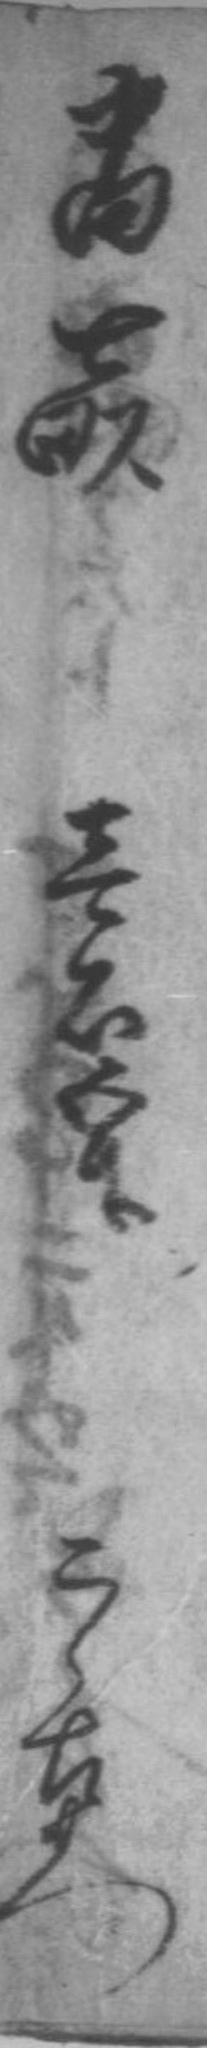中田七畝壱石五升二郎左衛門

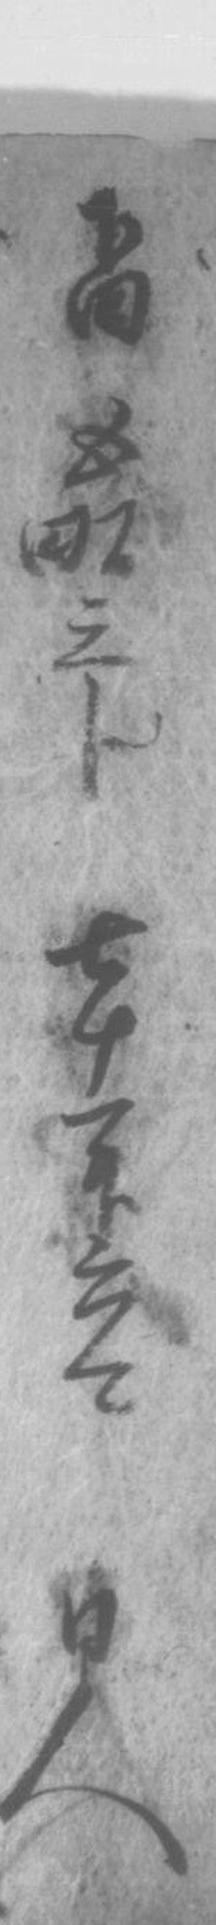下田五畝三分七斗一升六合同人
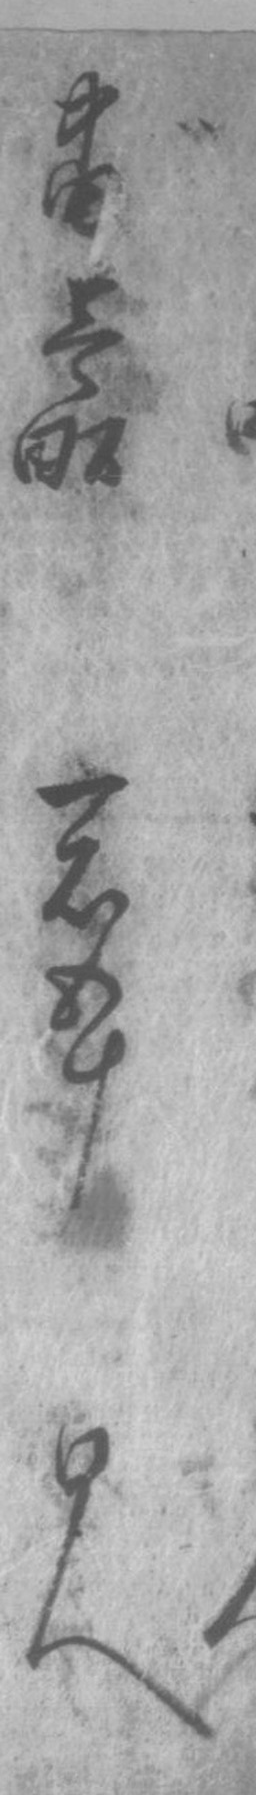中田壱畝壱石五斗同人
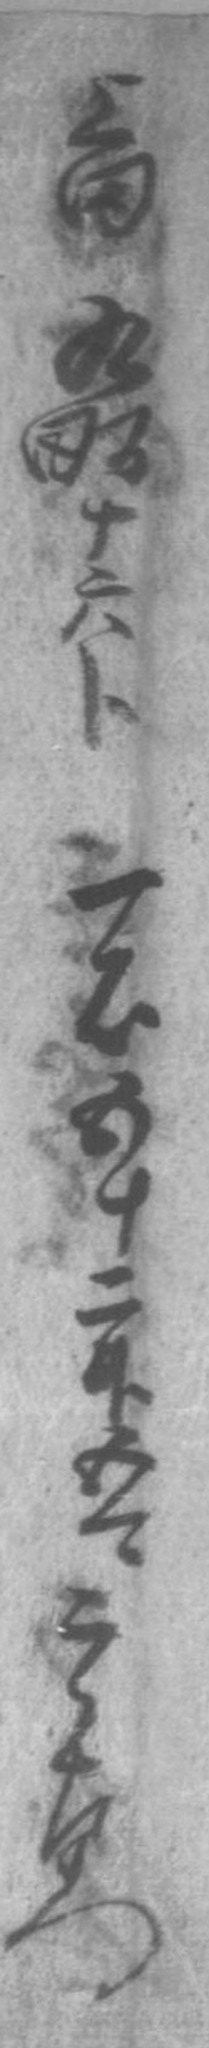上田畝十六分一石五斗二升五合二郎左衛門
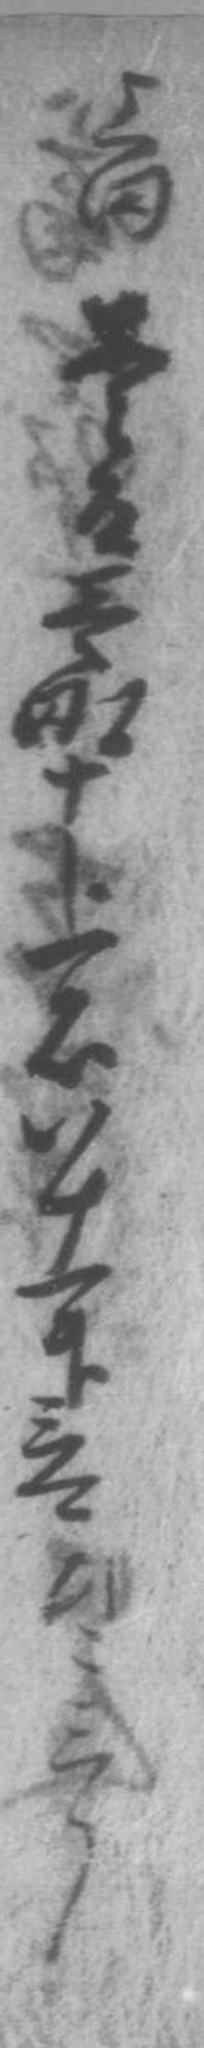上田壱反一畝十分一石八斗一升三合ひこ三郎
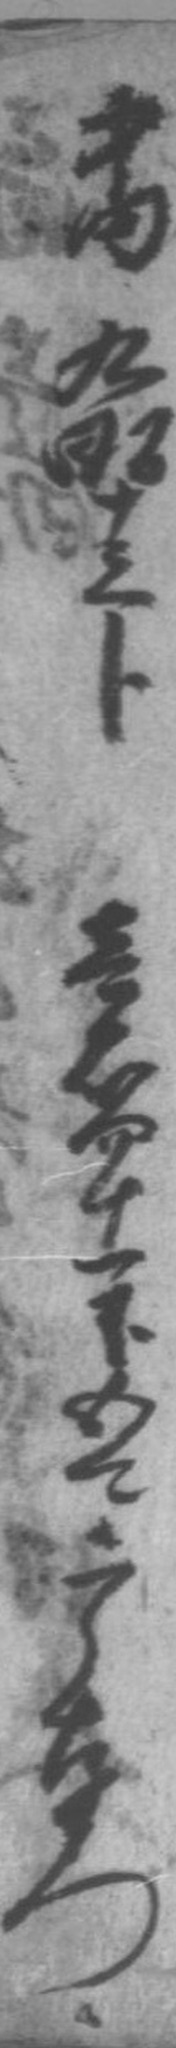中田九畝十三分壱石四斗一升五合二郎左衛門
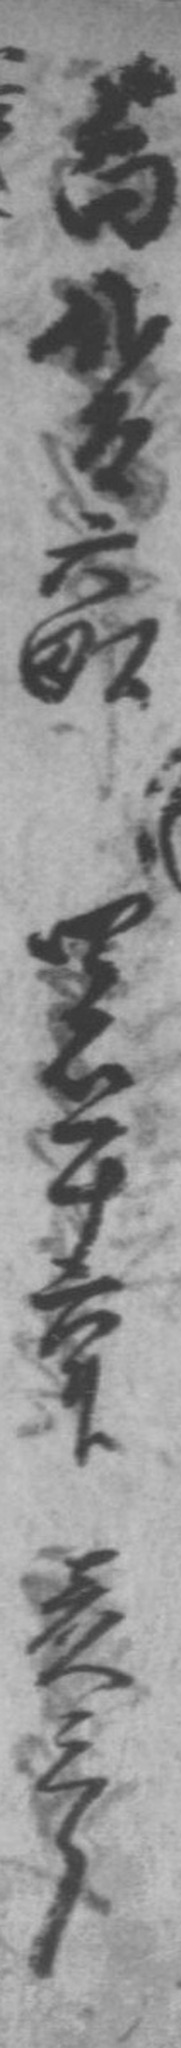上田弐反六畝四石一斗六升彦三郎
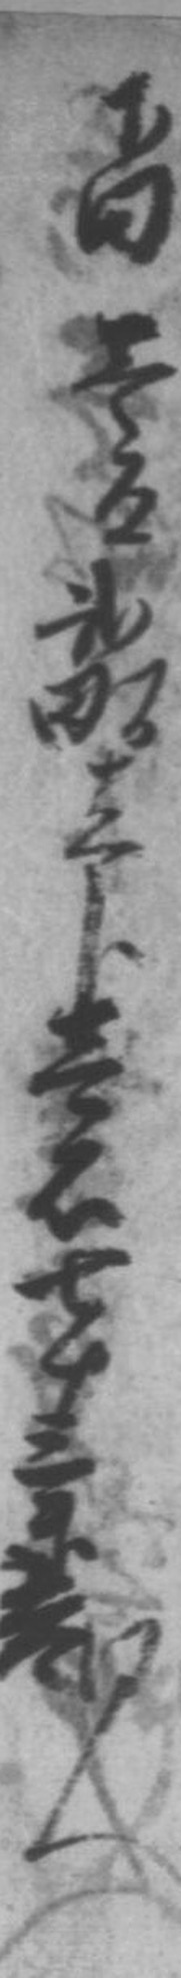下田壱反弐畝十二分壱石七斗三升壱合同人
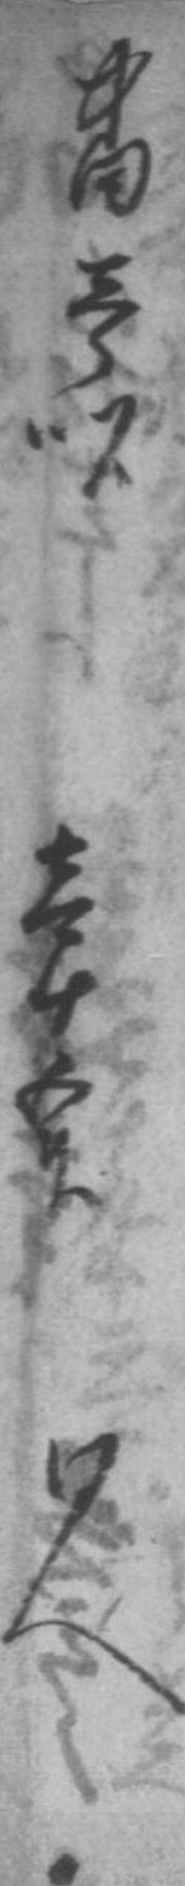中田壱畝壱斗五升同人
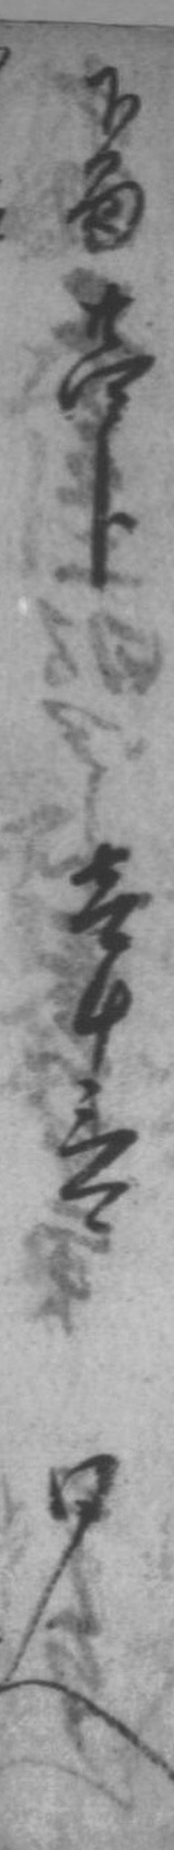下畠廿四分壱斗三合同人
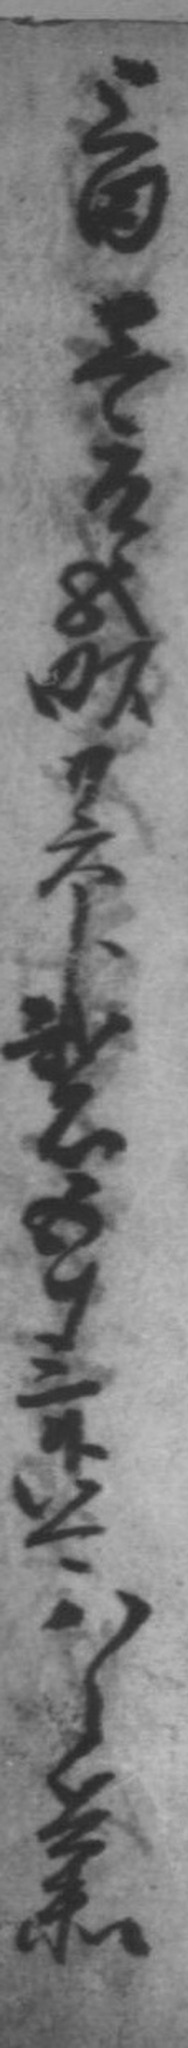上田壱反五畝廿六分弐石五斗三升八合八郎兵衛

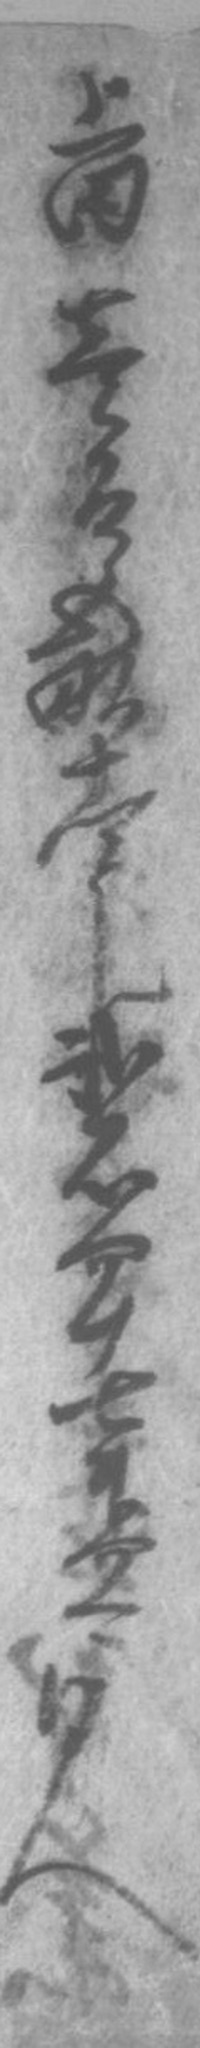上田壱反五畝十四分弐石四斗七升四合同人
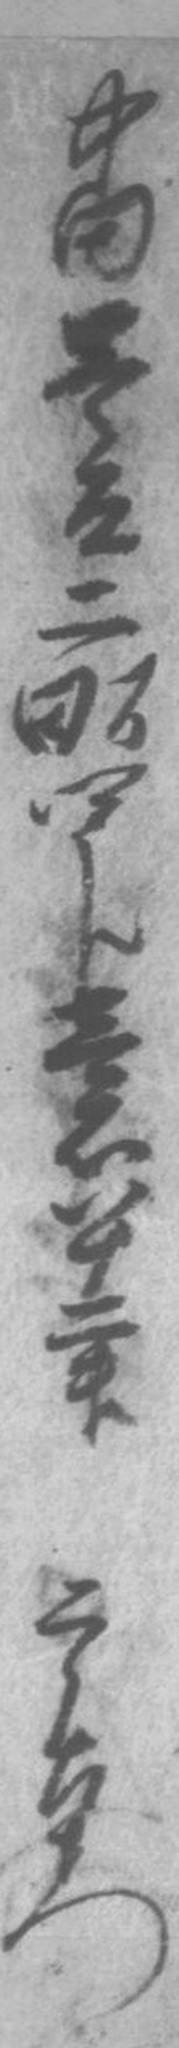中田壱反二セ四分壱石八斗二升二郎左衛門
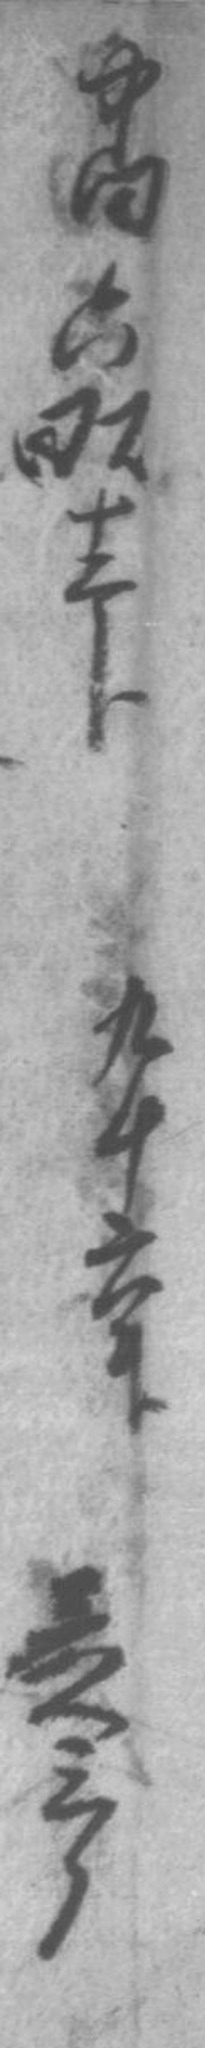中田六畝十二分九斗六升彦三郎
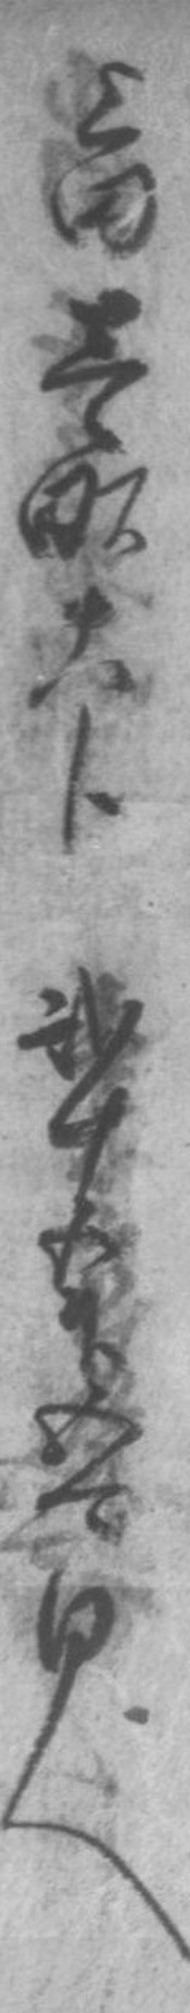上田壱畝十八分弐斗五升五合同人
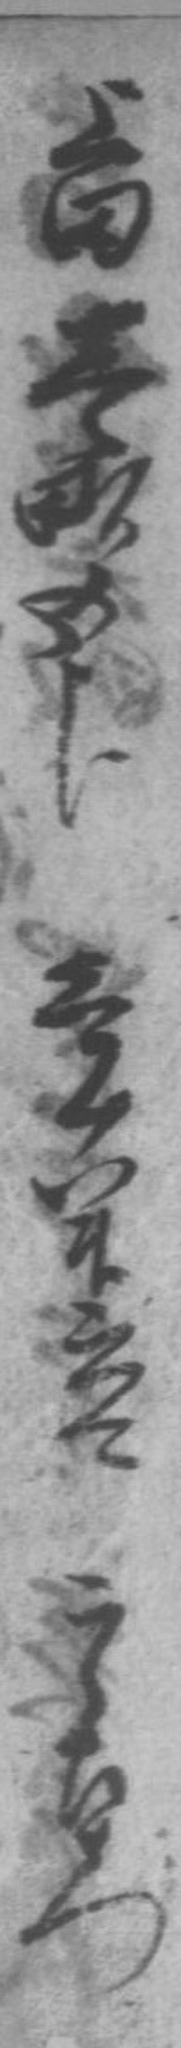上田壱畝五分壱斗八升六合二郎左衛門
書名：越州大野郡ノ内不動堂村御検地帳
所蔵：福井県文書館 Fukui Prefectural Archives
